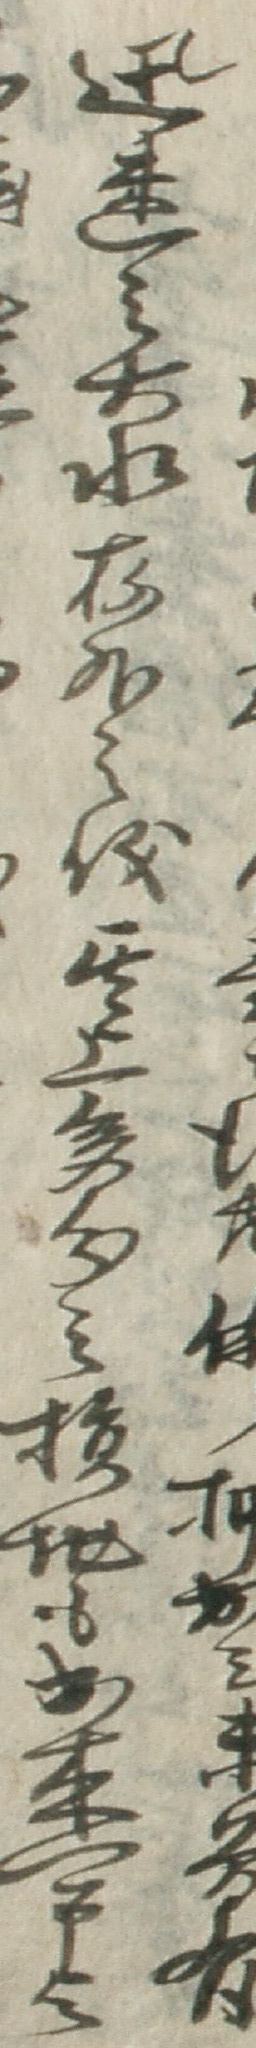迅速之大水存外之儀其上多分之損地も出来可申と
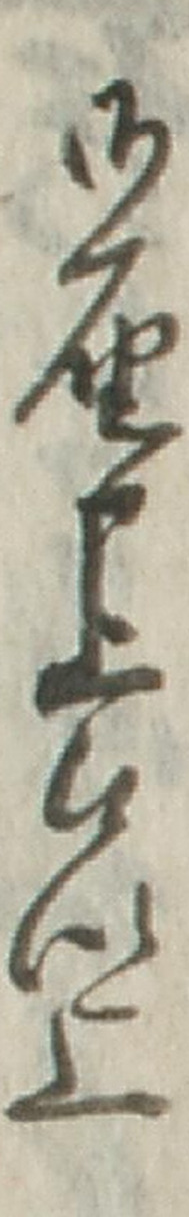御届申上候以上
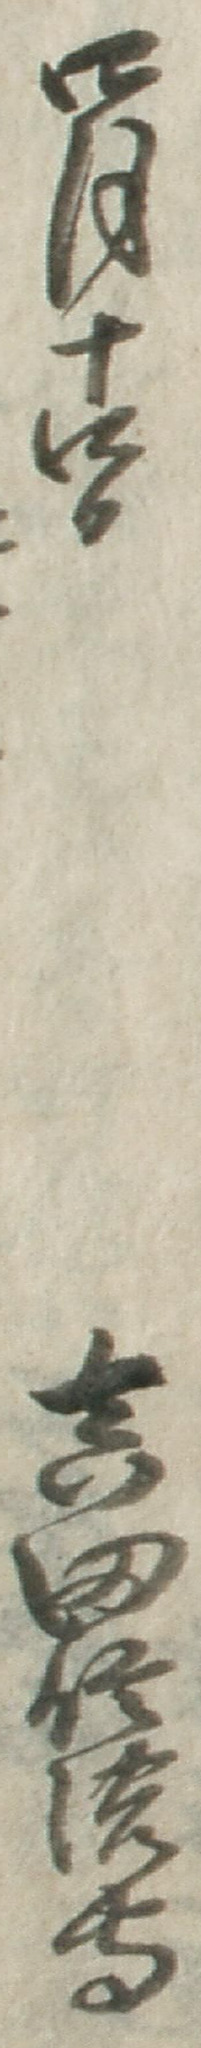四月十四日真田信濃守

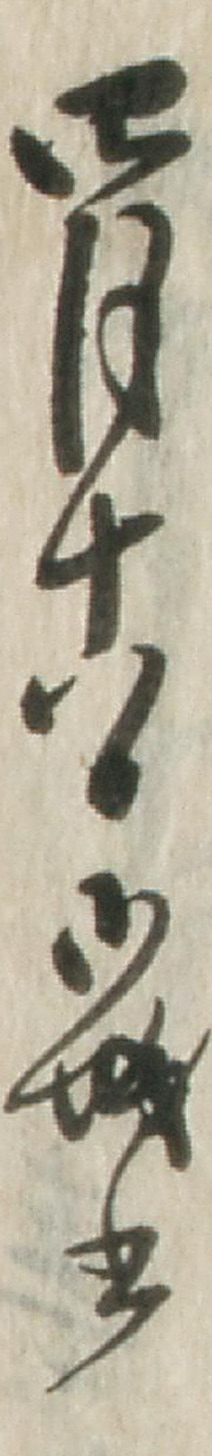四月十八日御城書
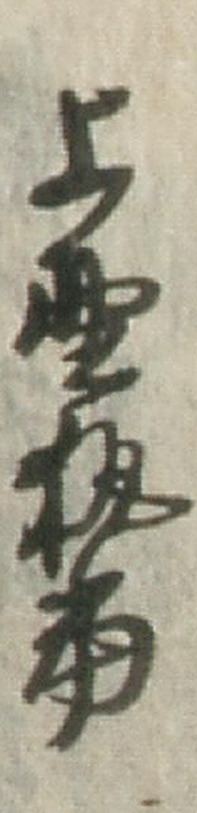上野執当
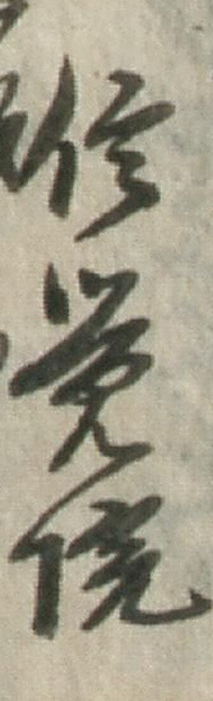信覚院
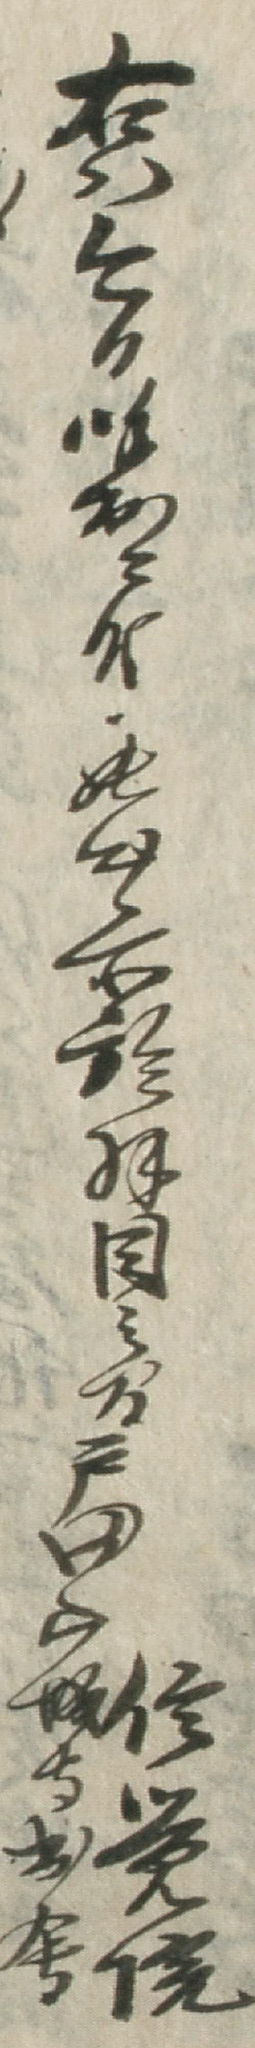右ハ今日呼出二付罷出候所於拝目之方戸田山城守出会
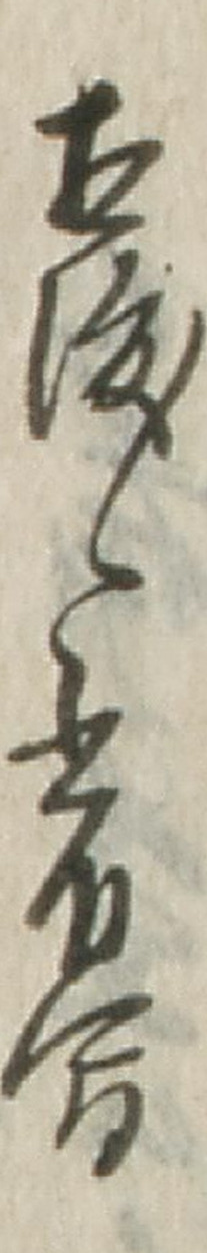相渡候書付写
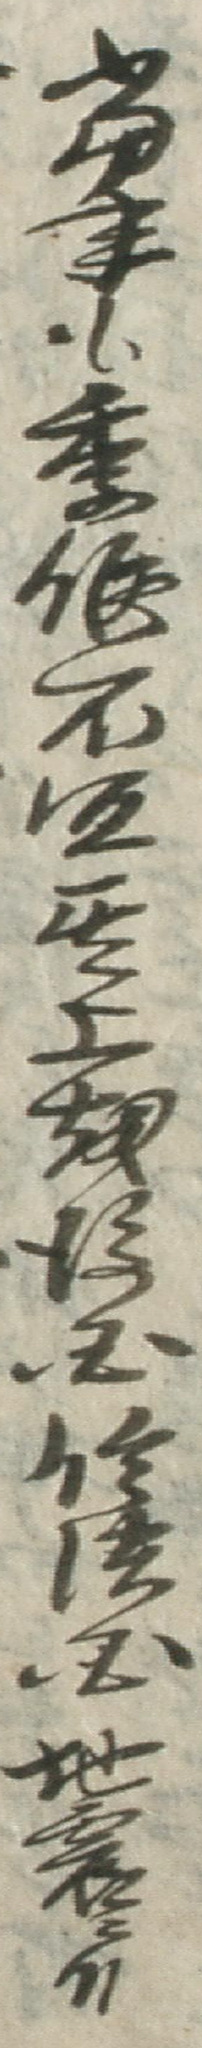当年も季候不宜其上越後国信濃国地震二付
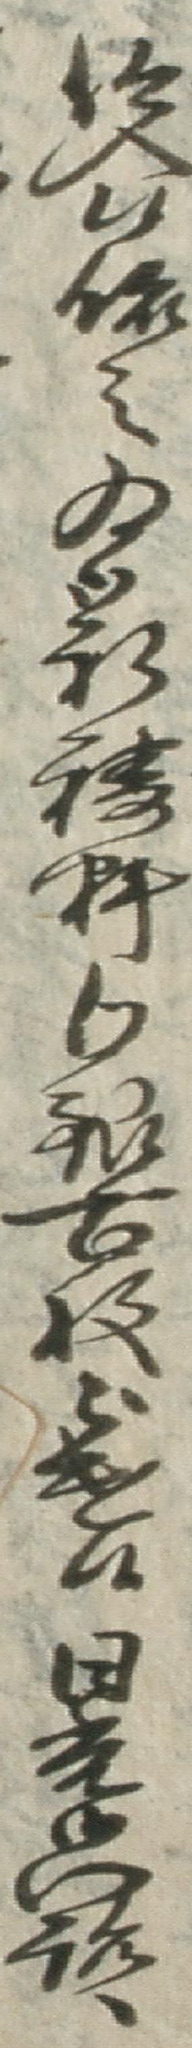仰入候依之為御祈祷料白銀百枚被遣候日光御門跡へ
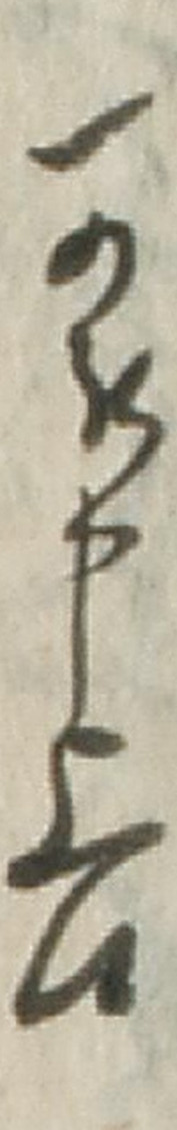可被申上候
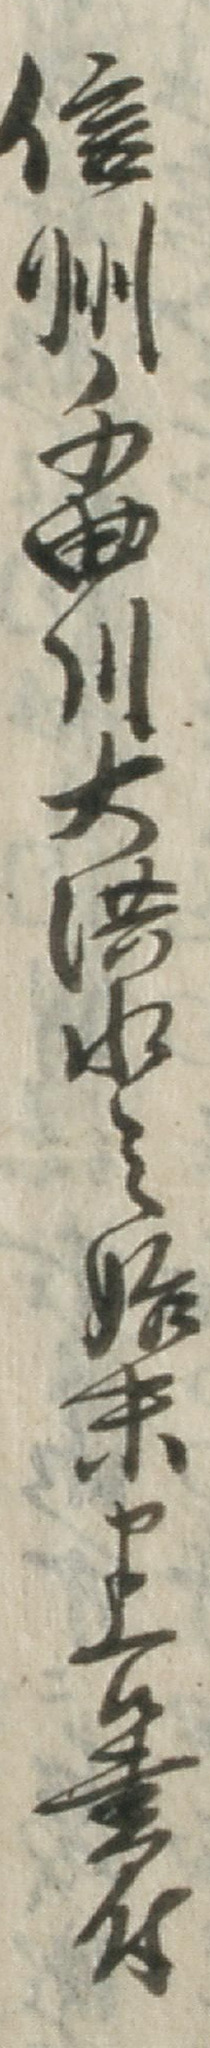信州千曲川大洪水之始末申上候書付
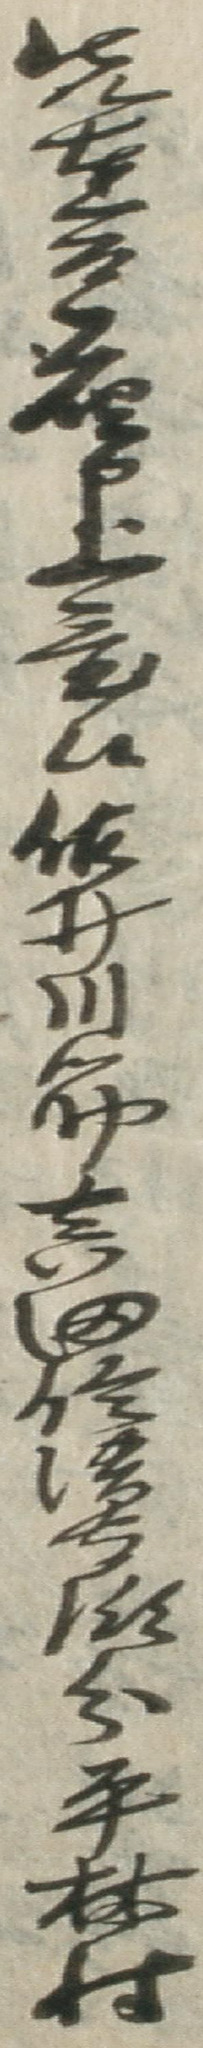先達而御届申上置候佐井川筋真田信濃守領分平林村
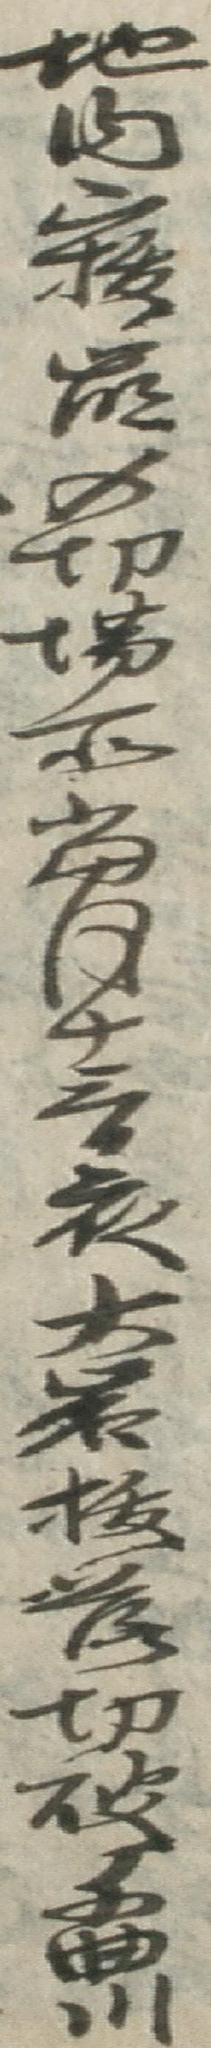地内山抜崩〆切場所当月十三日夜大岩抜落切破千曲川
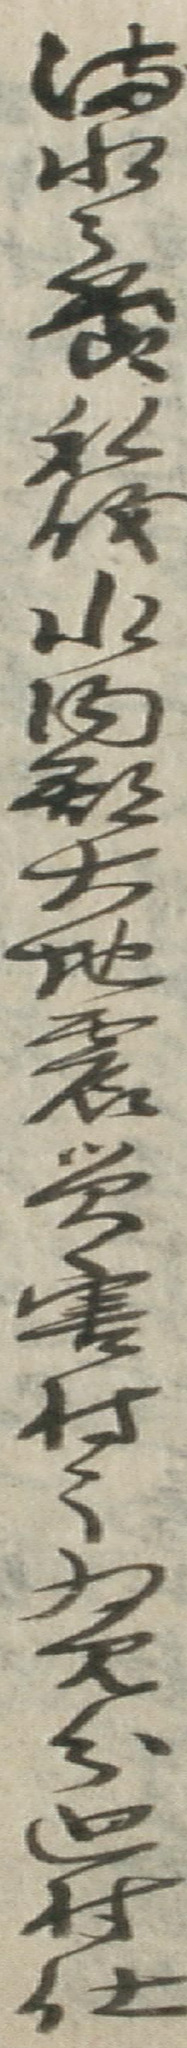満水之節私儀水内郡大地震災害村々為見分廻村仕
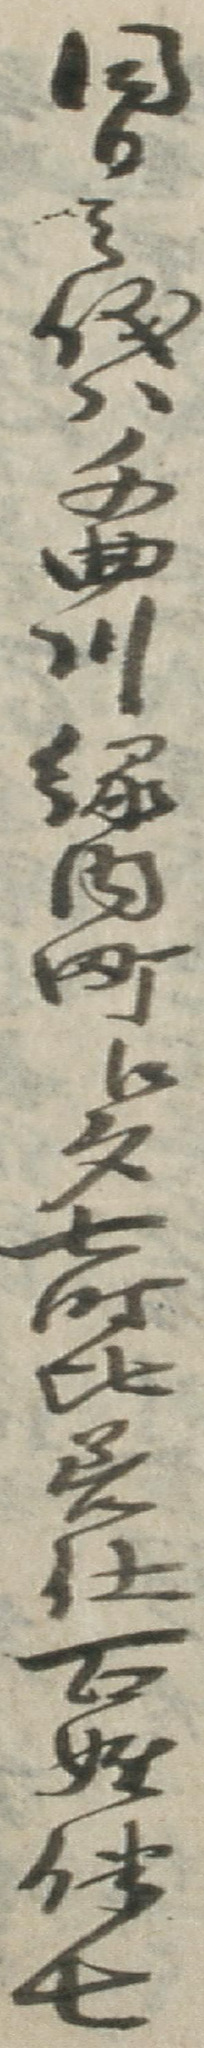同日之儀ハ千曲川縁内町江夕七時比着仕百姓伴七
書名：信濃國地震實録記
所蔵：東京大学地震研究所図書室 Earthquake Research Institute Library, The University of Tokyo, JAPAN
